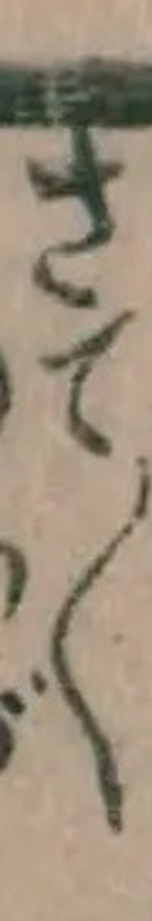さて〳〵
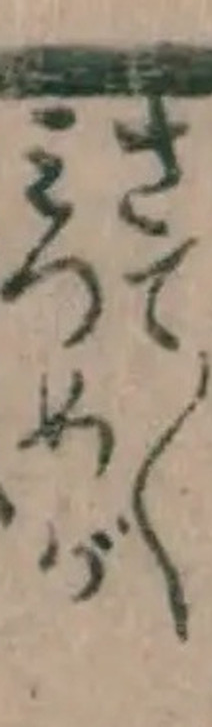みつめが
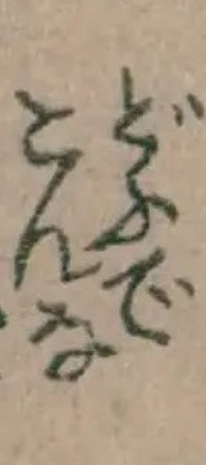どふで
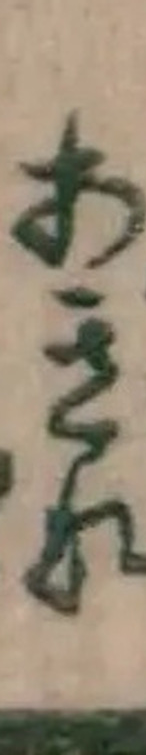あきれ
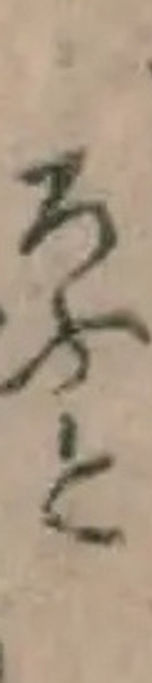ろふと
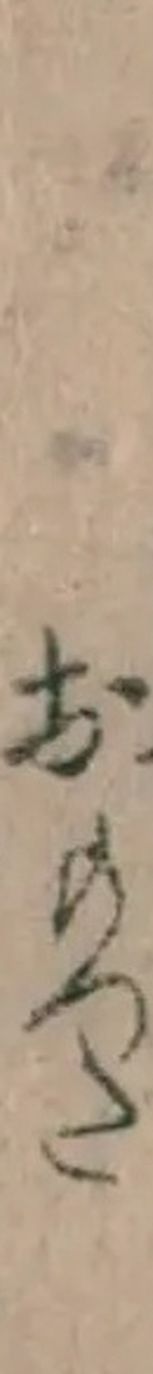おもつた
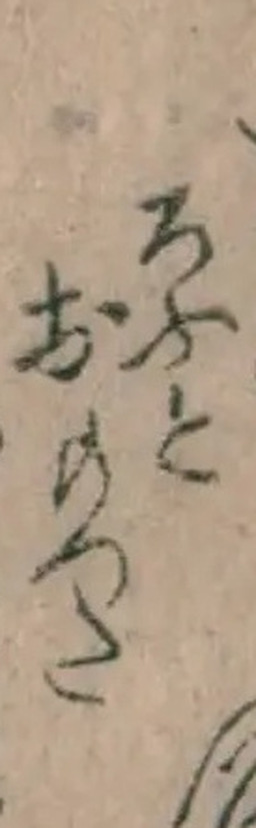おもつた
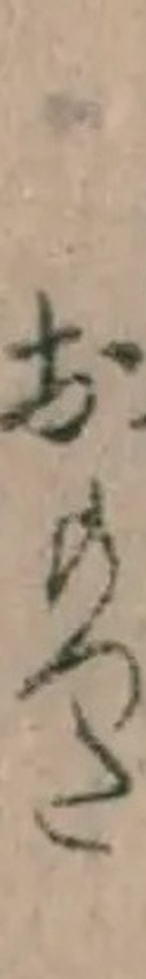おもつた
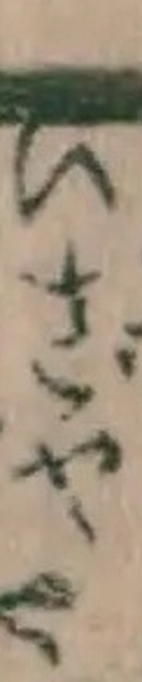いざや
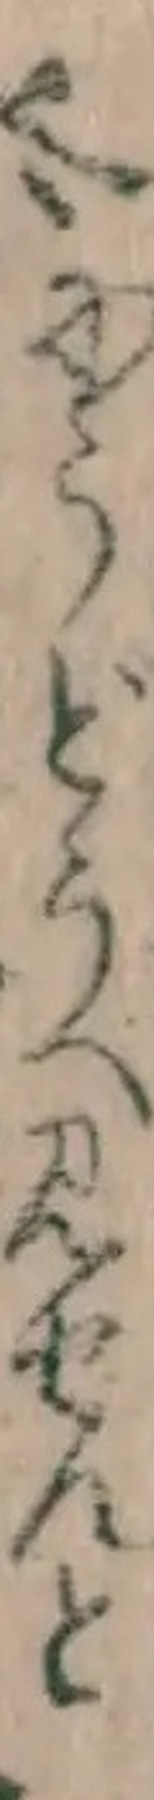にうどうへ見せんと
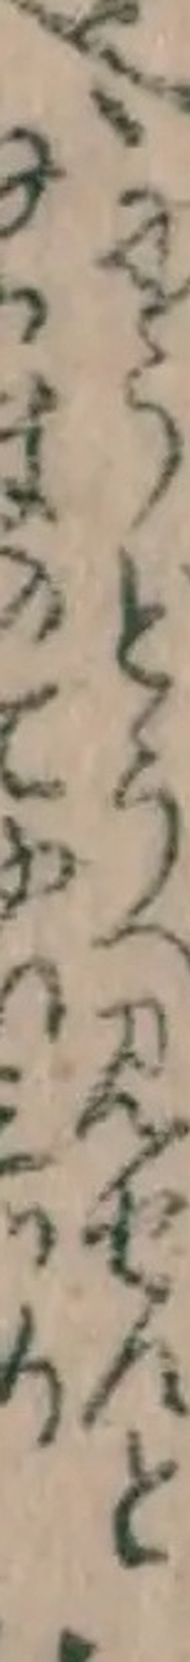なかまのてやい三つめ
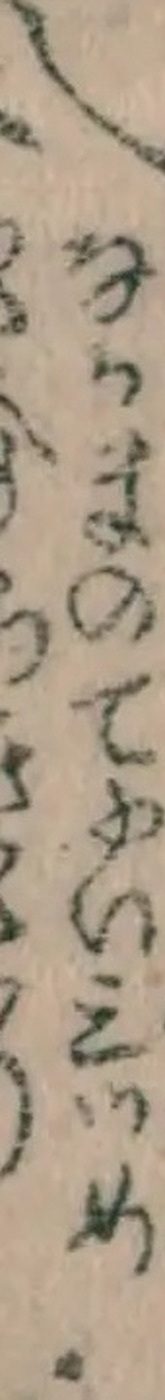なかまのてやい三つめ
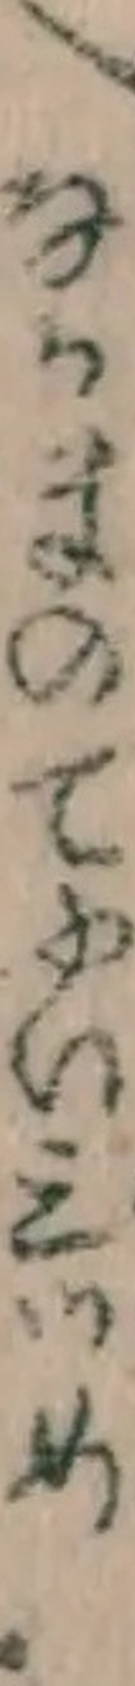なかまのてやい三つめ
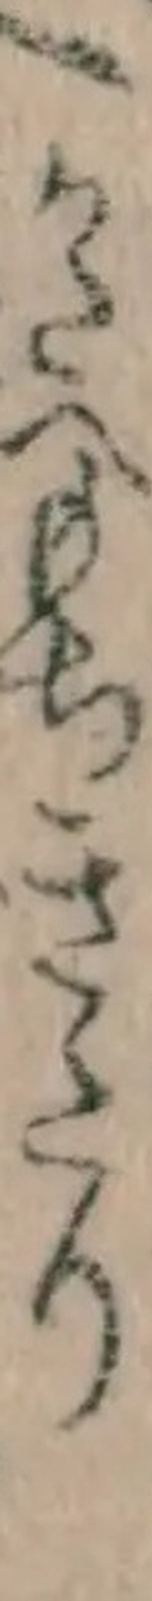かたへもちきたり
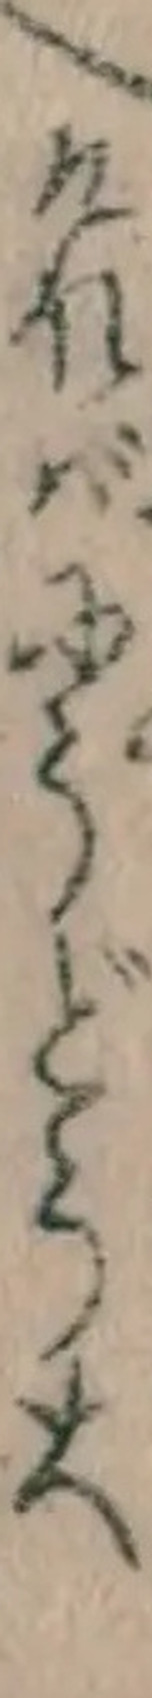ければにうどう大
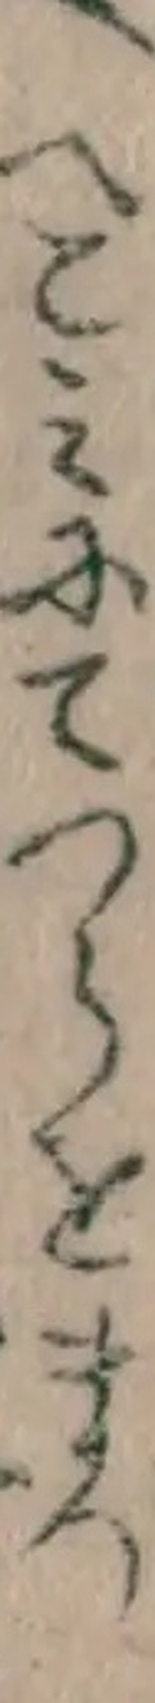へこみにてつらをまつ
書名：信有奇怪会
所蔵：国立国会図書館 National Diet Library, JAPAN
